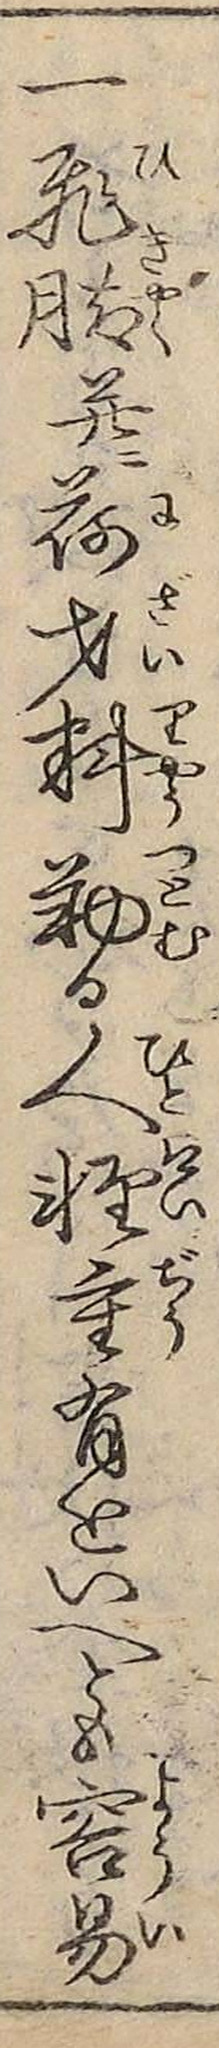一飛脚并荷才料勤る人軽重有といへとも容易

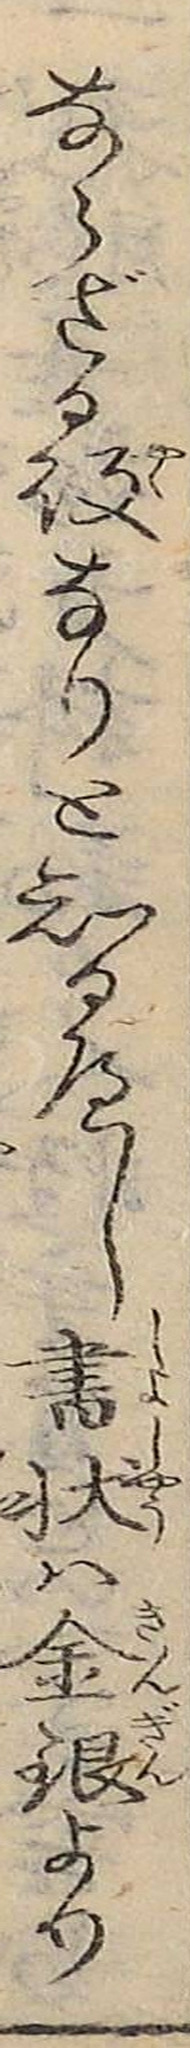ならざる役なりと知るへし書状は金銀より
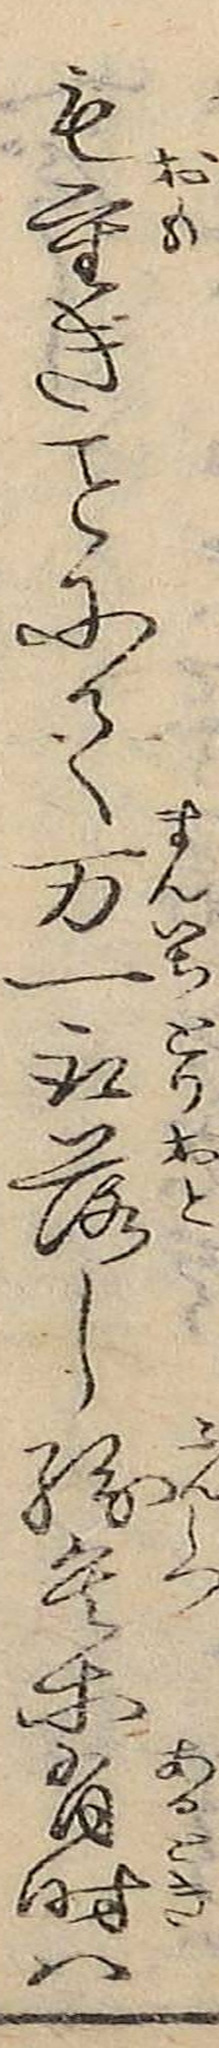も重きことにて万一取落し紛失等有時は
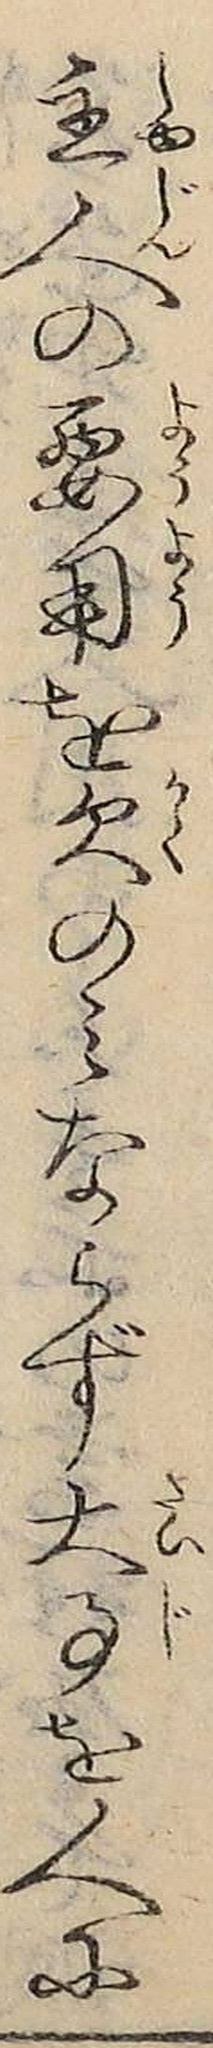主人の要用を欠のみならず大事を人に
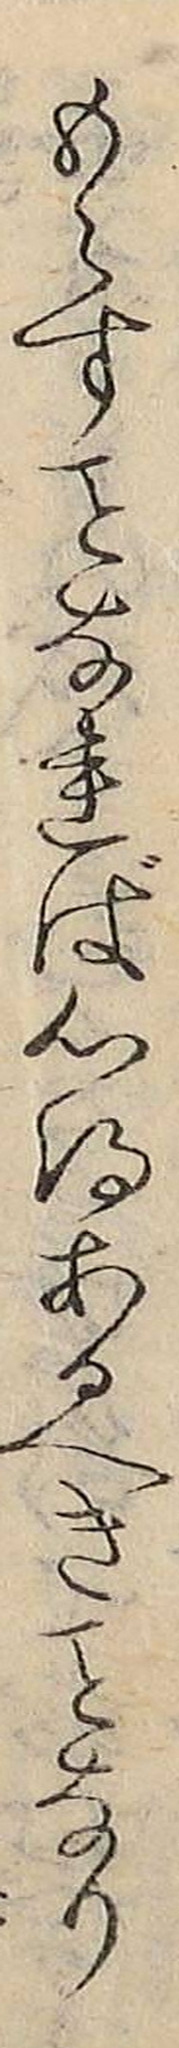もらすことなれば心得あるへきことなり
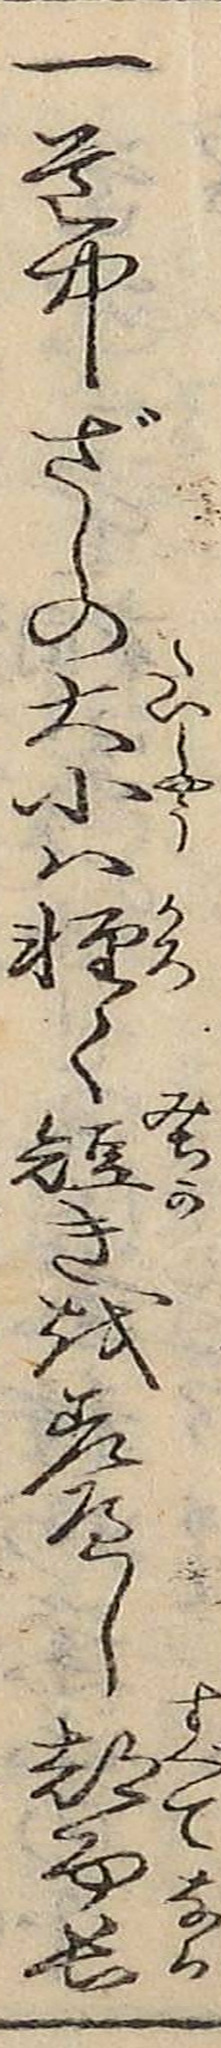一道中ざしの大小は軽く短きを差へし都而長
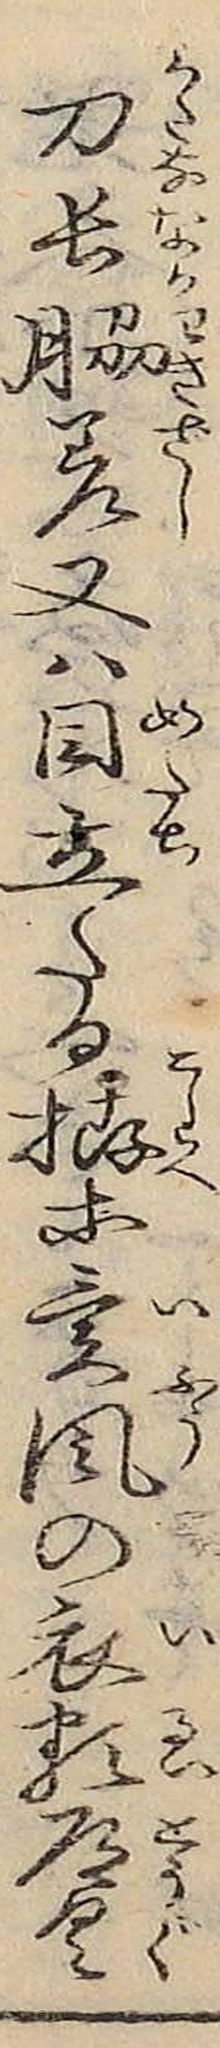刀長脇差又は目立たる拵等異風の衣類道具
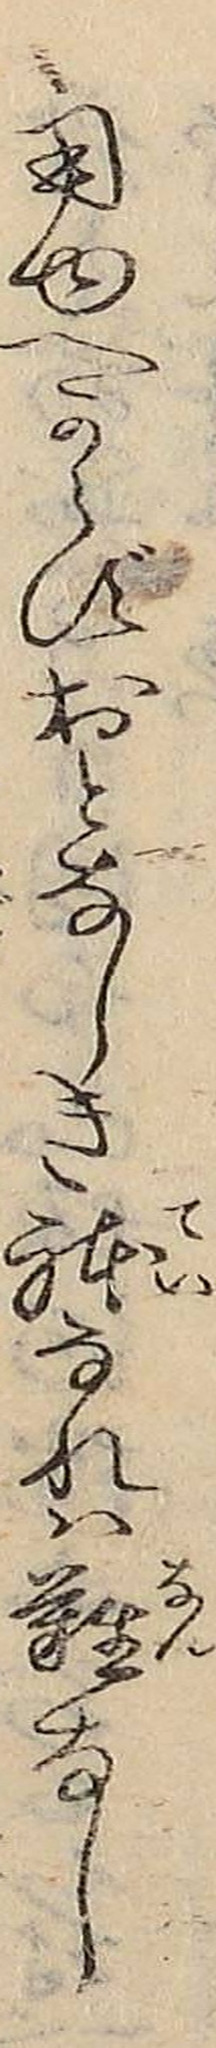用ゆへからずおとなしき体なれは難なし
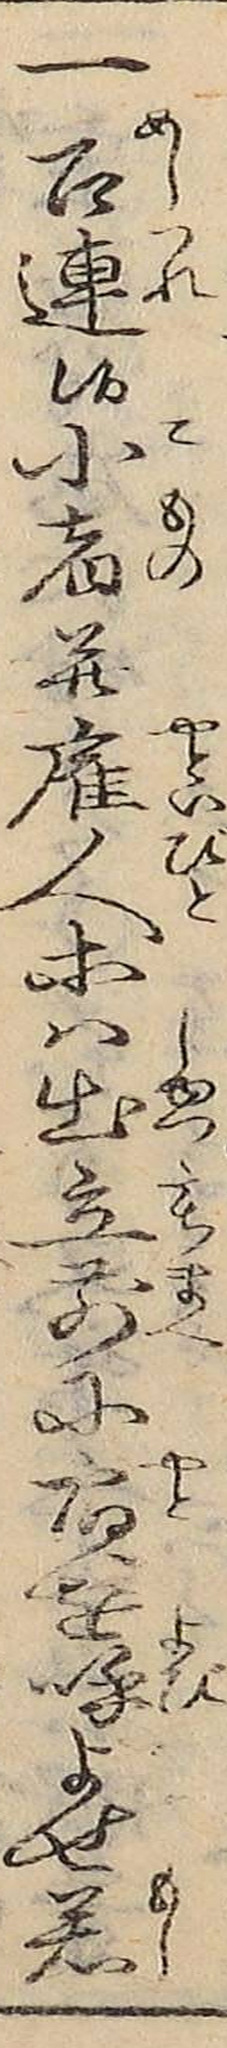一召連候小者并雇人等は出立前に宿を呼よせ若
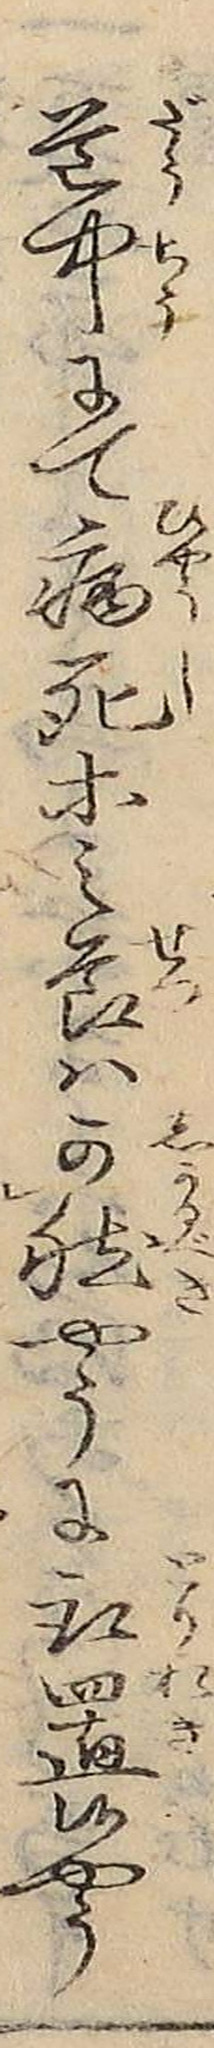道中にて病死等之節は可然やうに取置候やう
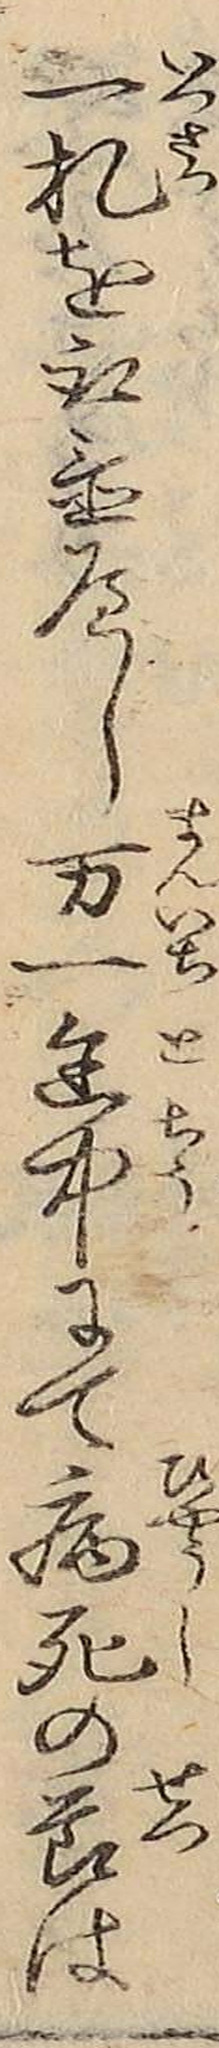一札を取置へし万一途中にて病死の節は
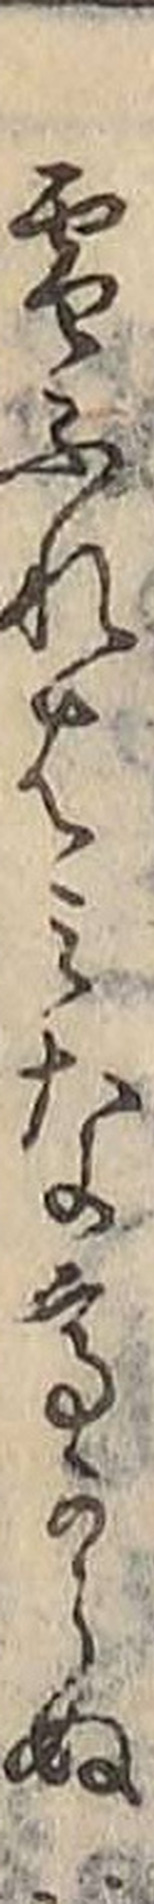雪ふれはみな高からぬ
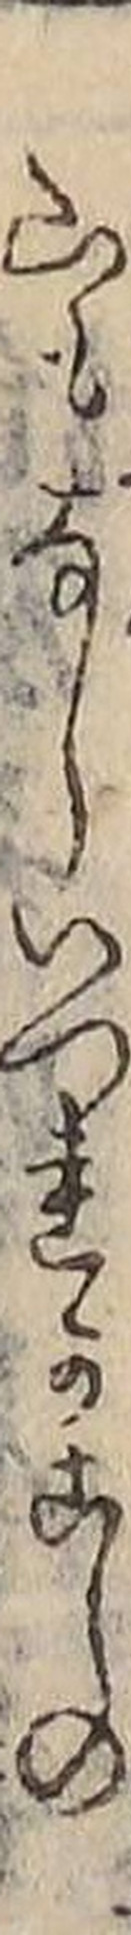山もなしいつれのこしの
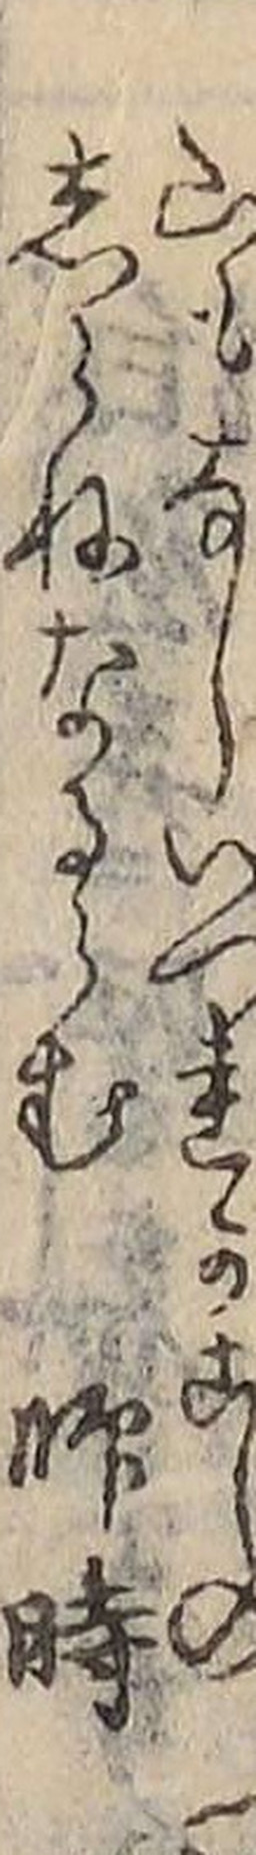しらねなるらむ師時

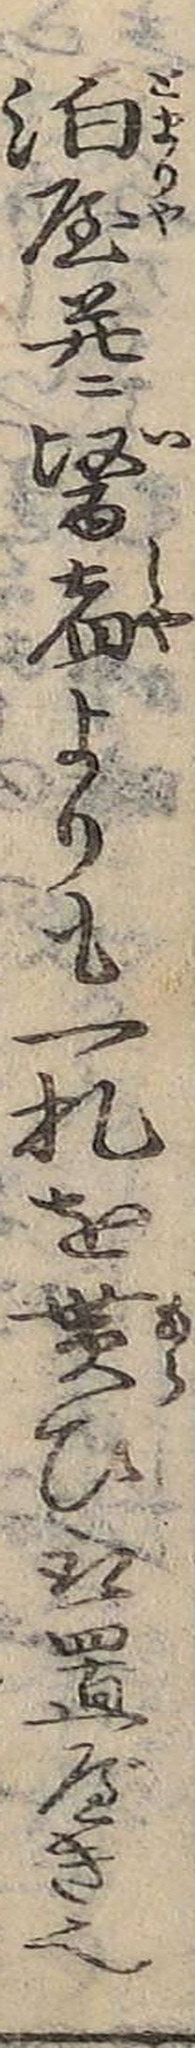泊屋并医者よりも一札を貰ひ取置べき也
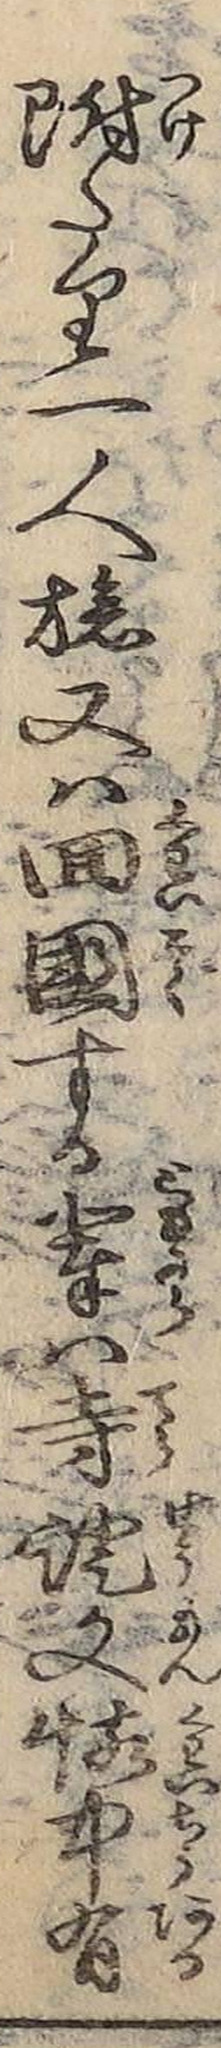附たり一人旅又は回国する輩は寺証文懐中有
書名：旅行用心集
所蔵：神戸大学附属図書館 国文学研究資料館
